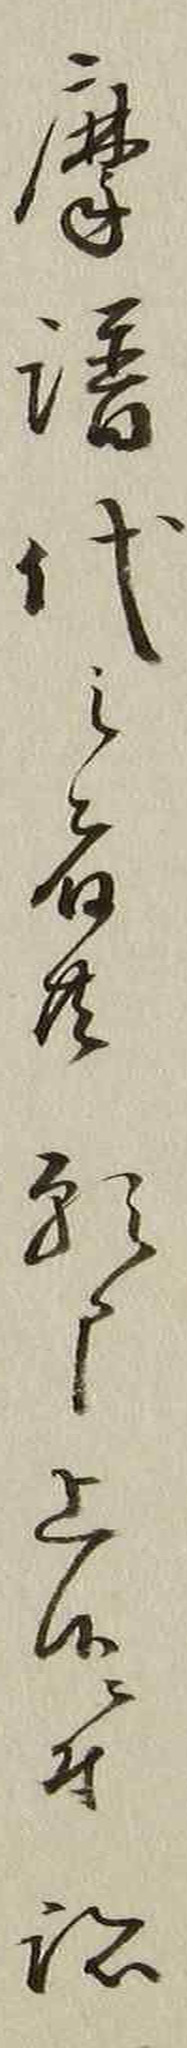摩譜代之者共願申上候に付跡
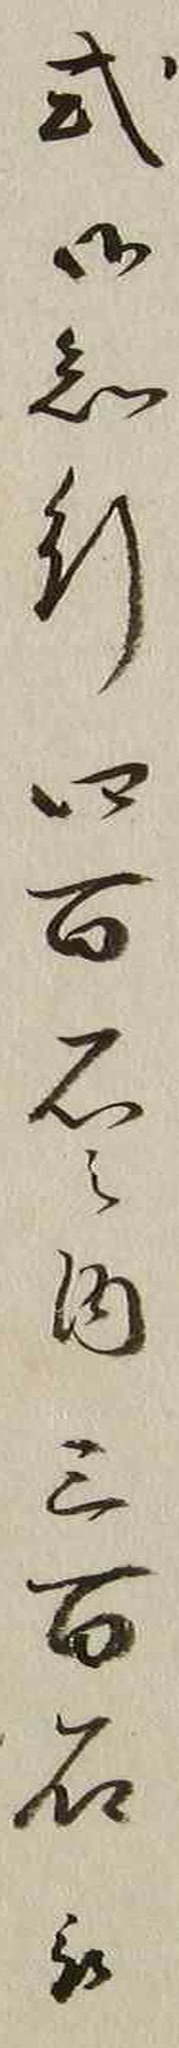式御知行四百石之内三百石被
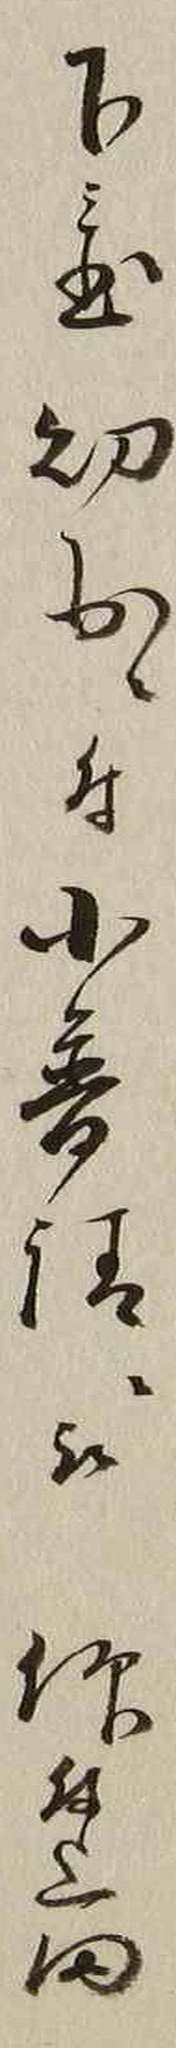下置幼少に付小普請に被仰付上田
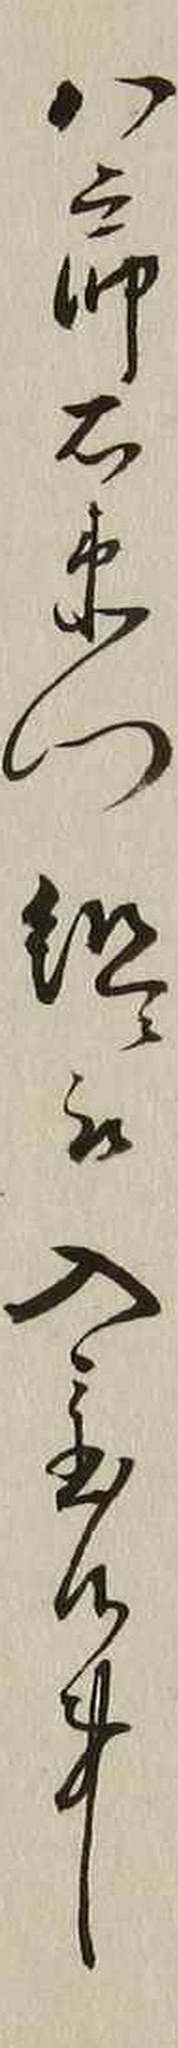八郎右衛門組に被入置候事
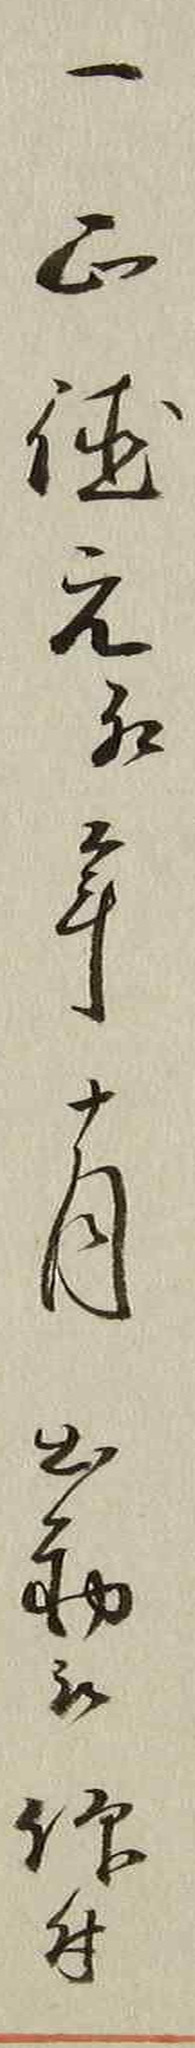一正徳元卯年十月出勤被仰付
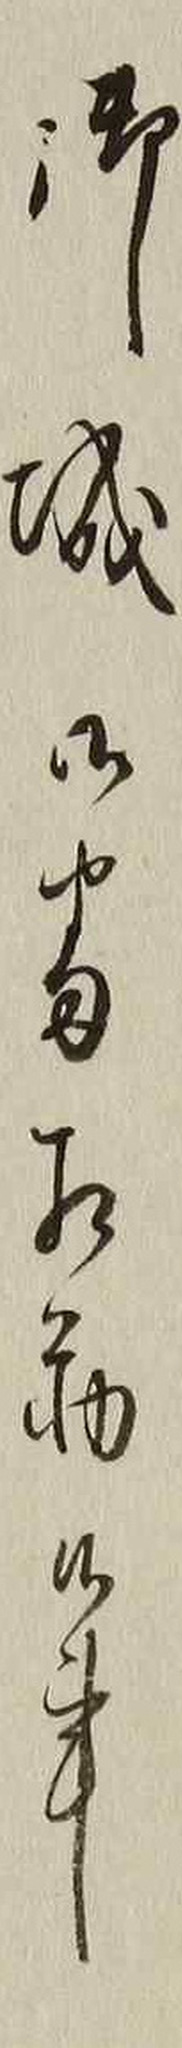御城御番相勤候事
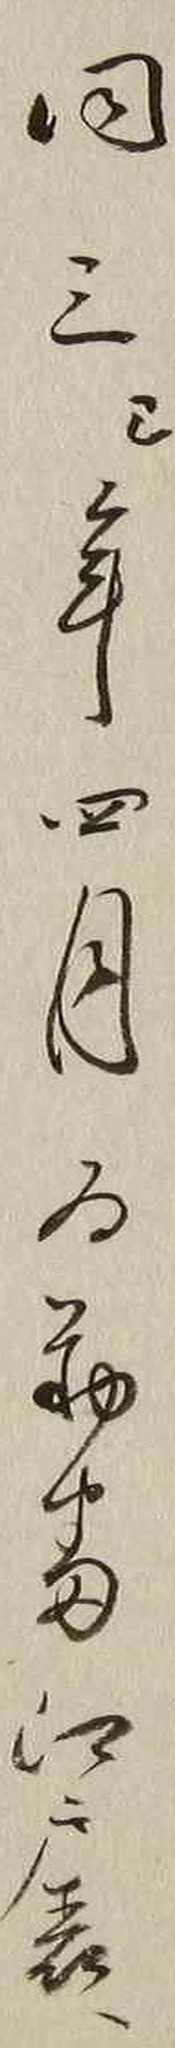同三巳年四月為勤番江戸表へ
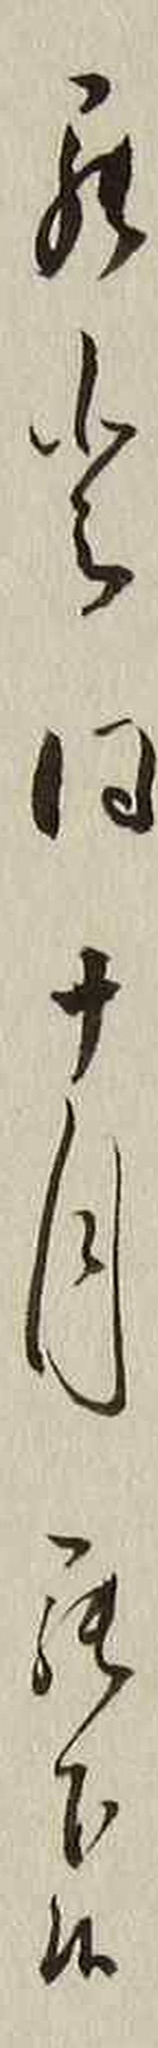罷登同十月罷下候
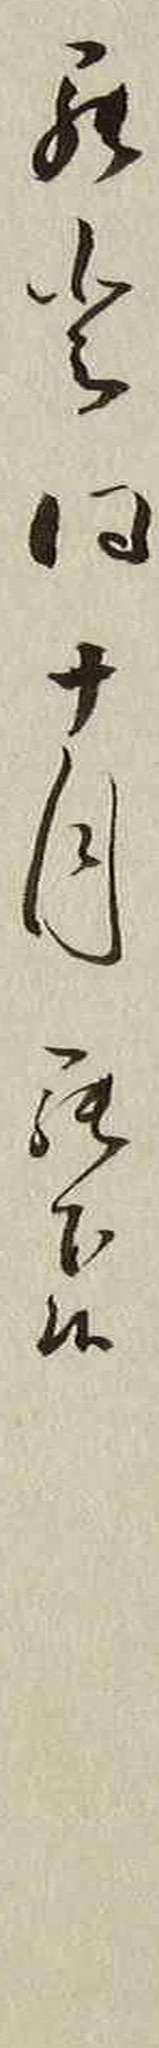罷登同十月罷下候
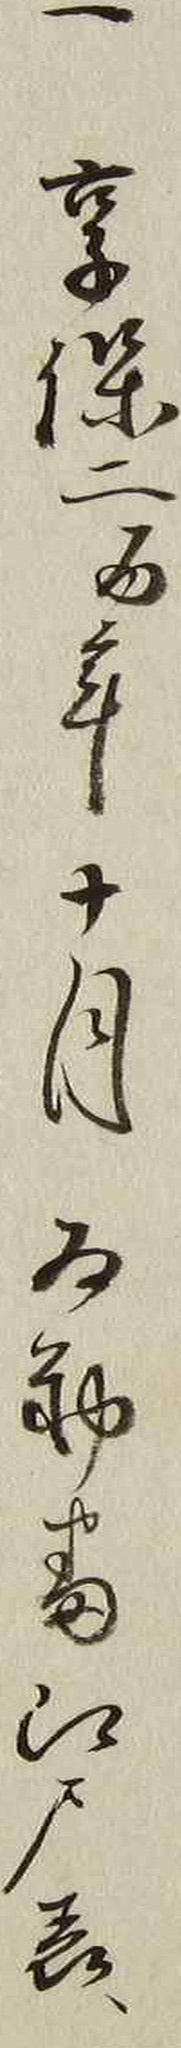一享保二酉年十月為勤番江戸表へ
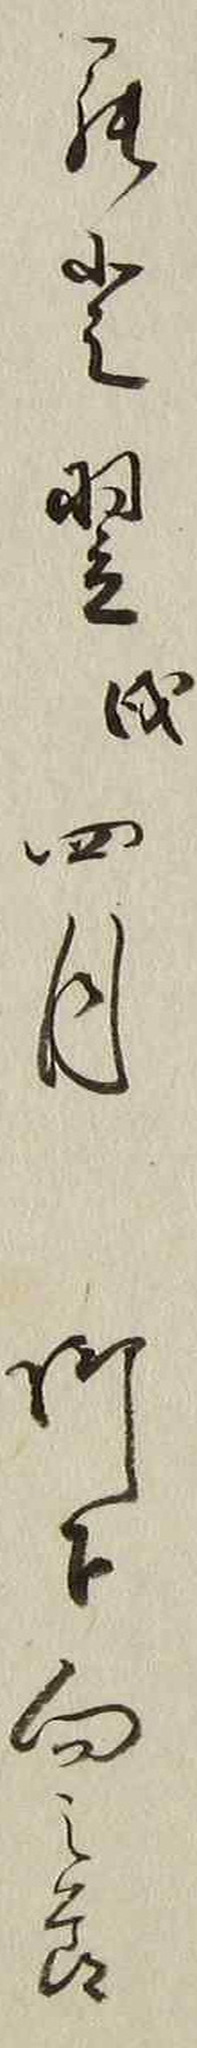罷登翌戌四月御下向之節
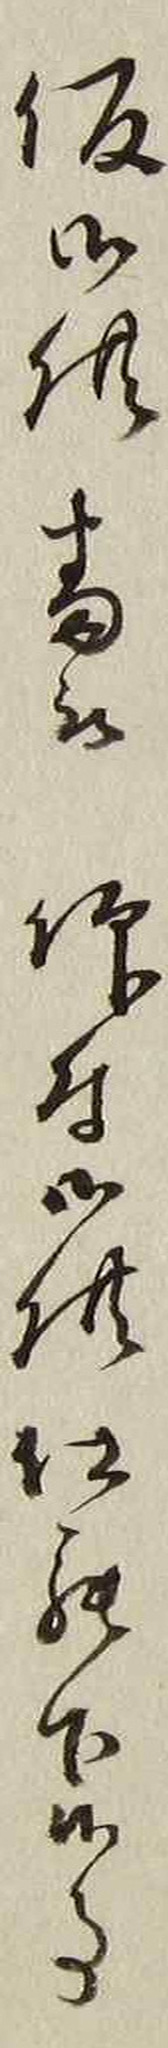仮御供番被仰付御供仕罷下候事
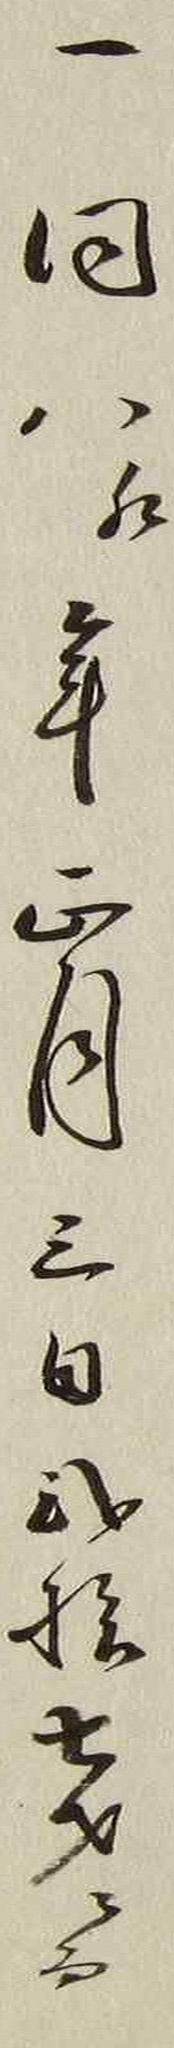一同八卯年正月三日弐拾七才に而
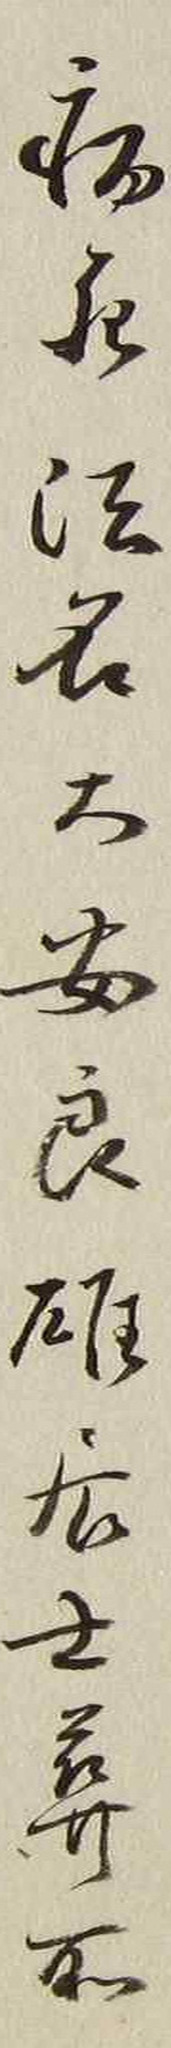病死法名大安良雄居士葬所
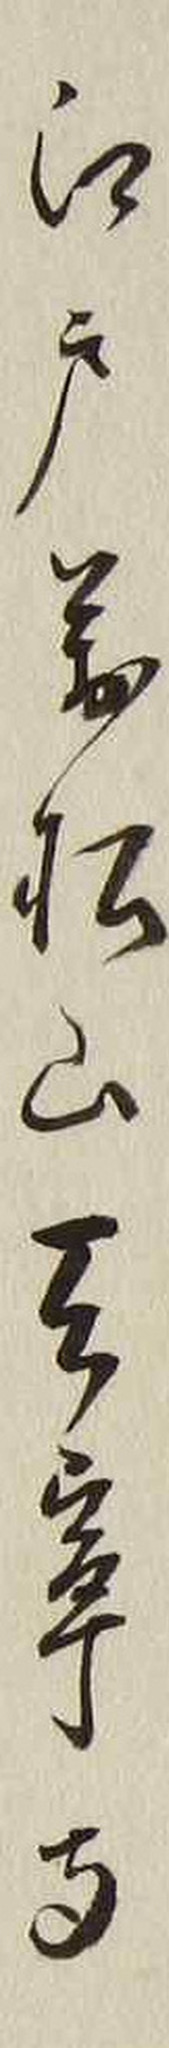江戸万松山天寧寺

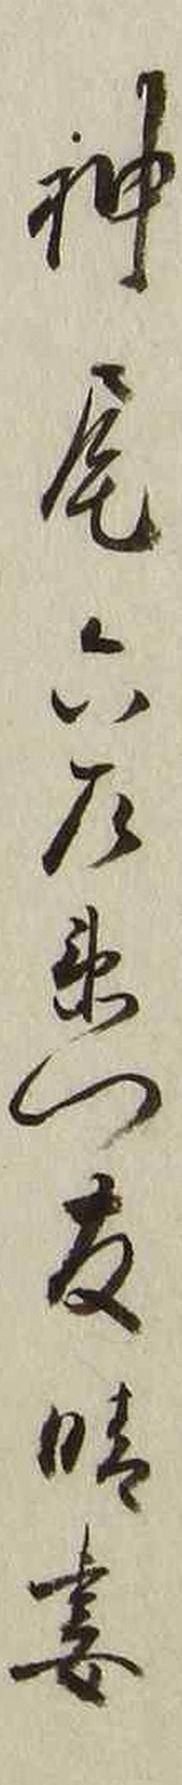女神尾六左衛門友晴妻
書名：諸士系譜　巻之159　な之部1
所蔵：会津若松市立会津図書館
